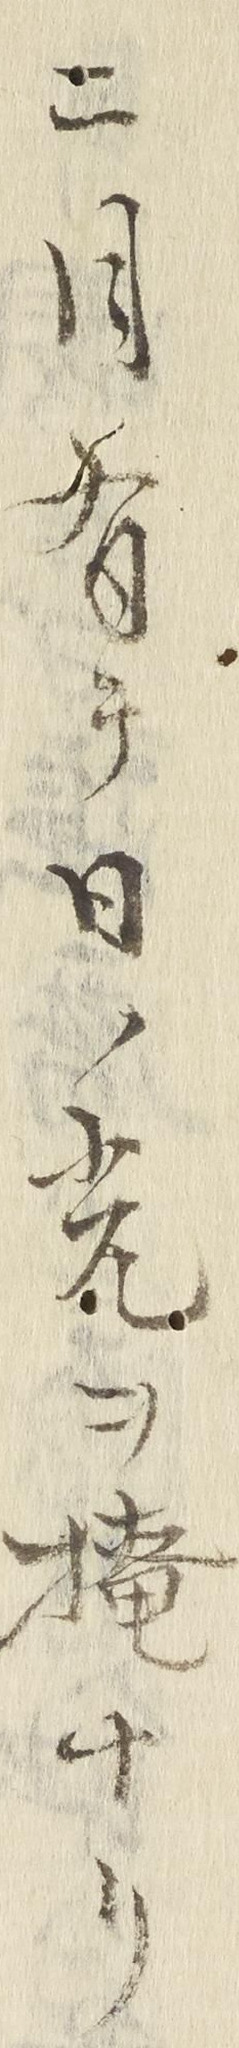ニ月有テ日ノ光ヲ掩ナリ
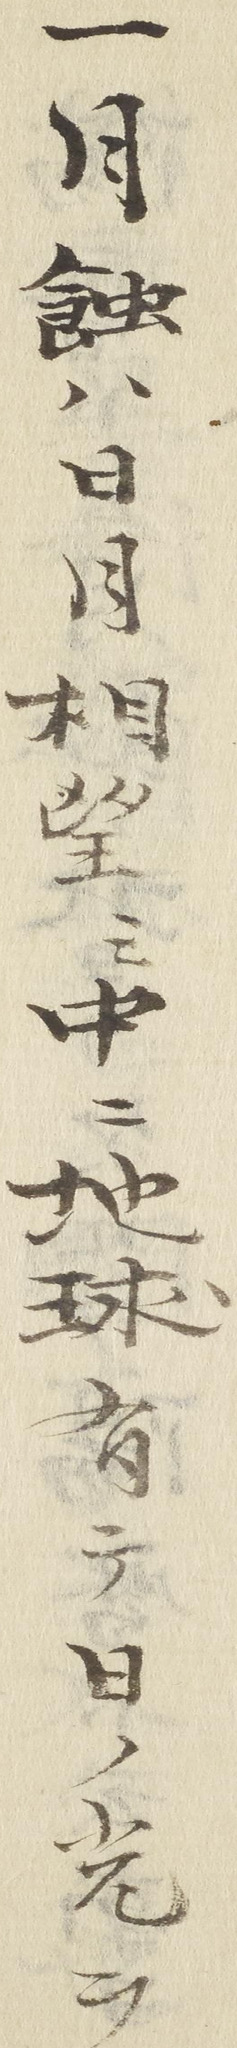一月蝕ハ日月相望ミ中ニ地球有テ日ノ光ヲ
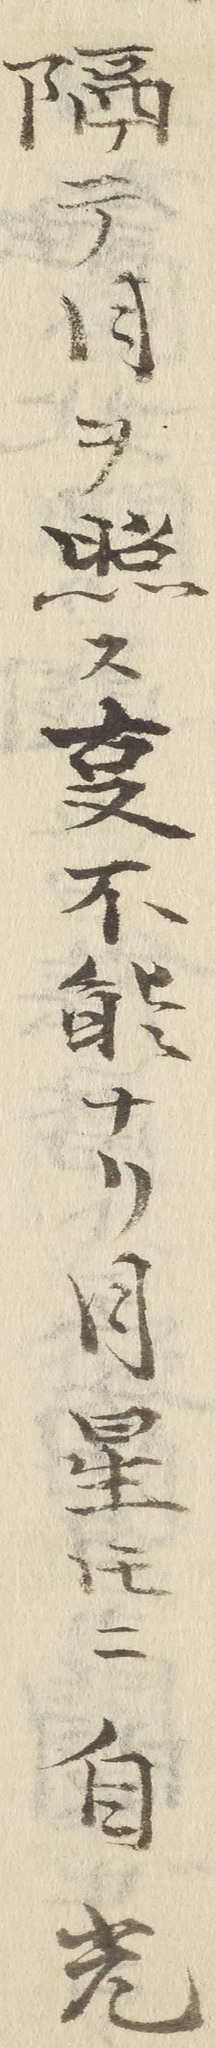隔テ月ヲ照ス事不能ナリ月星トモニ自光
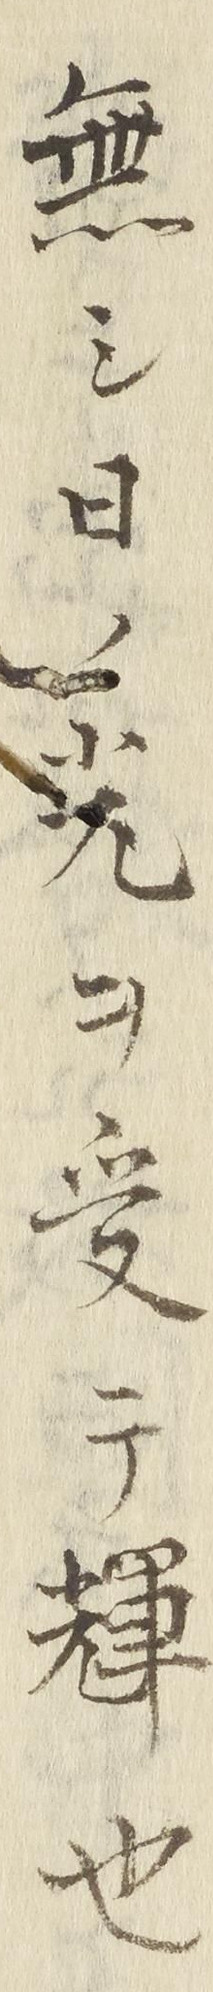無シ日ノ光ヲ受テ輝也
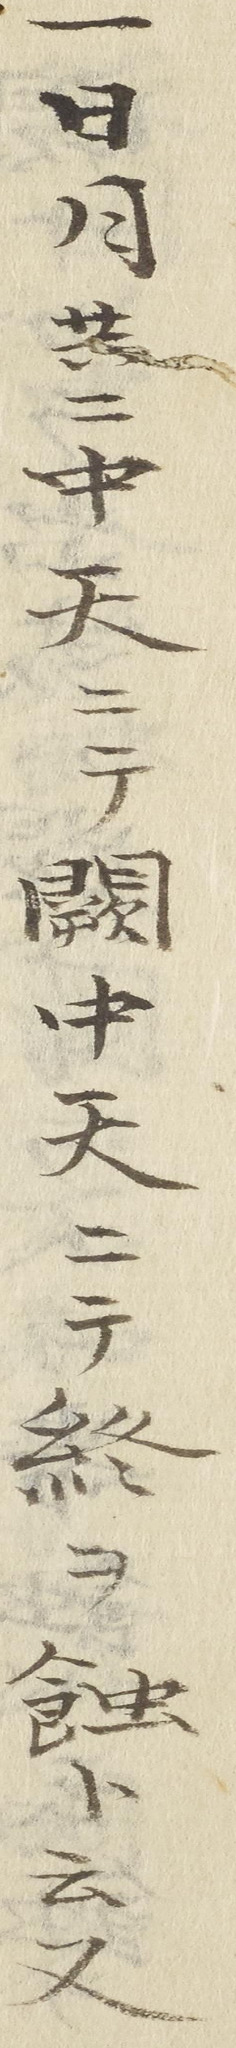一日月共ニ中天ニテ闕中天ニテ終ヲ蝕ト云又

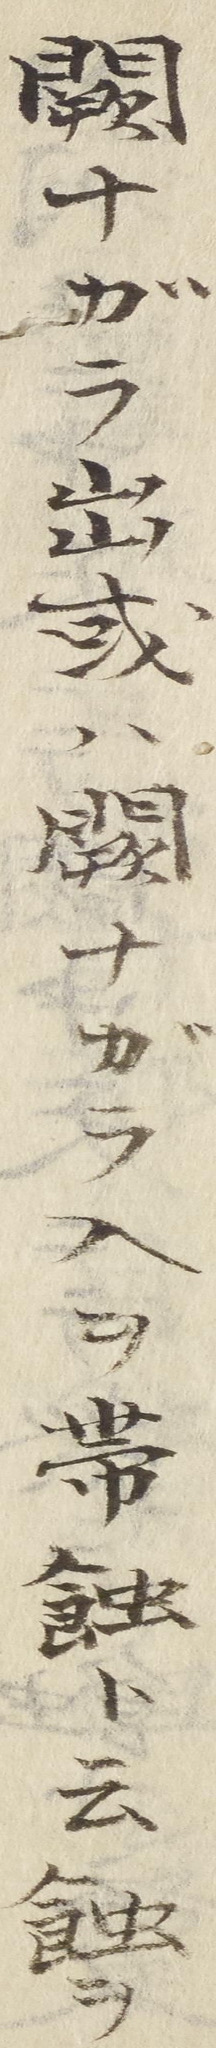闕ナガラ出或ハ闕ナガラ入ヲ帯蝕ト云蝕ヲ
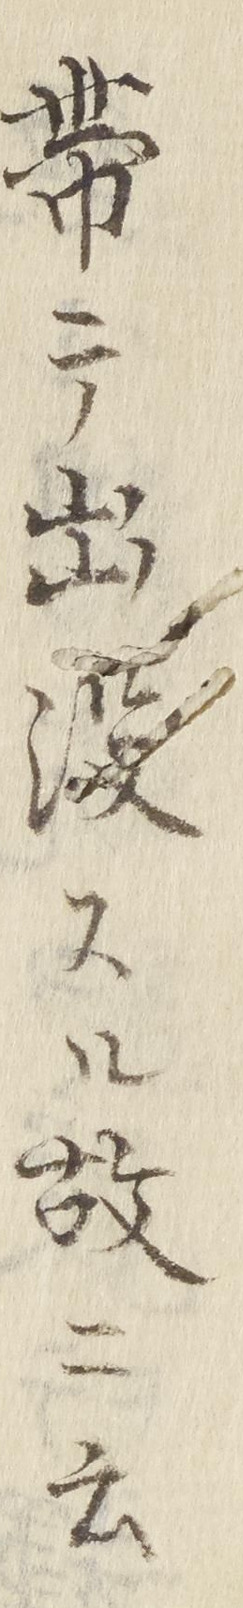帯テ出没スル故ニ云
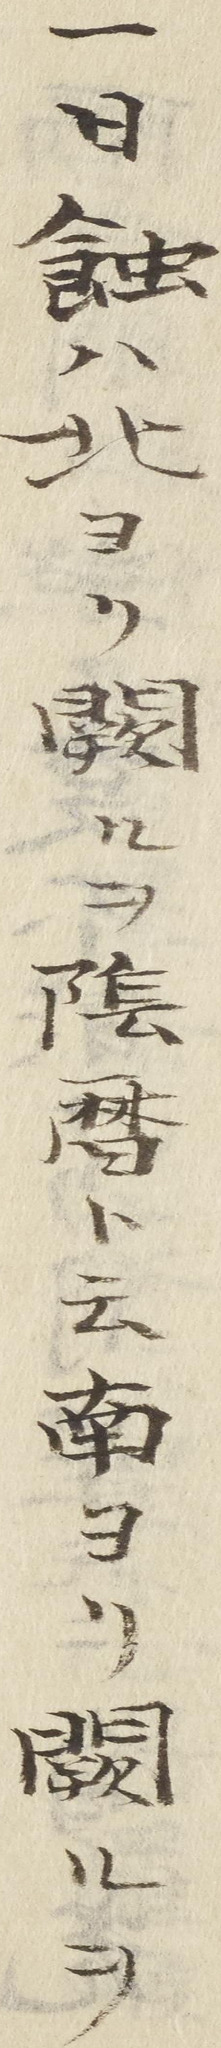一日蝕ハ北ヨリ闕ルヲ陰暦ト云南ヨリ闕ルヲ
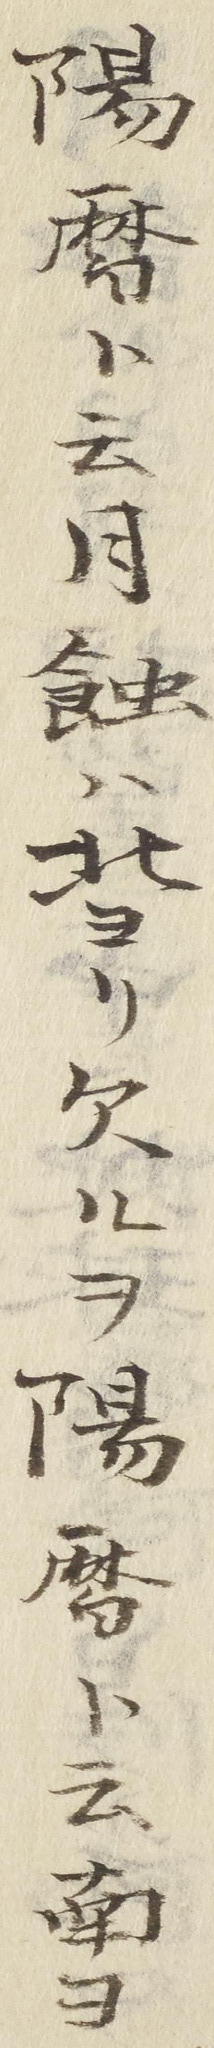陽暦ト云月蝕ハ北ヨリ欠ルヲ陽暦ト云南ヨ
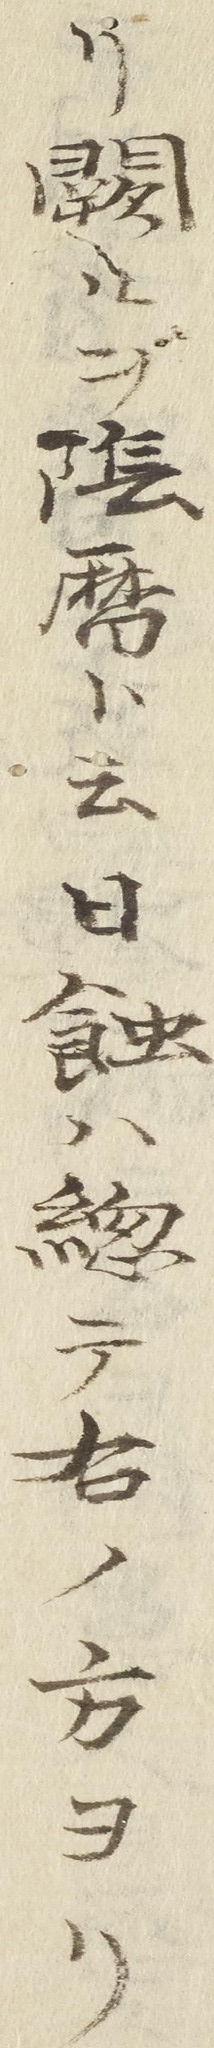リ闕ルヲ陰暦ト云蝕ハ総テ右ノ方ヨリ
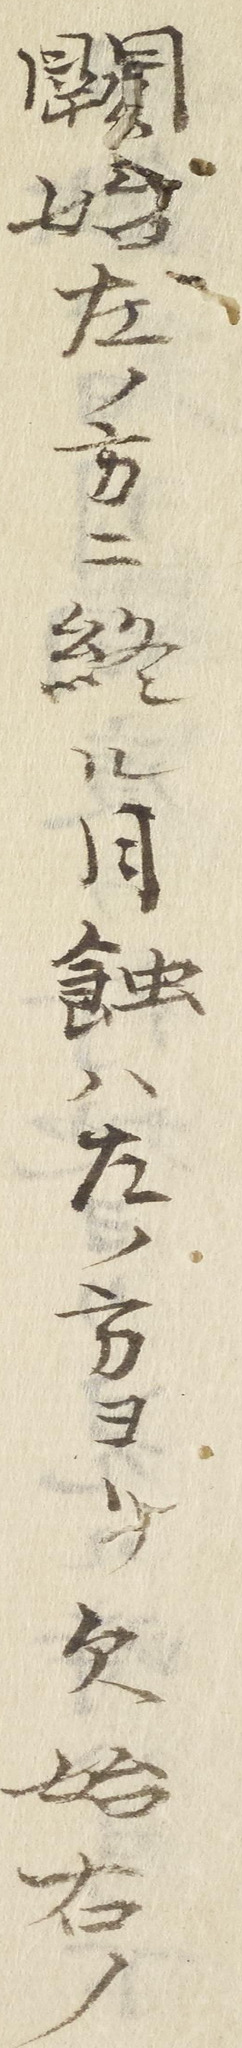闕始左ノ方ニ終ル月蝕ハ左ノ方ヨリ欠始右ノ
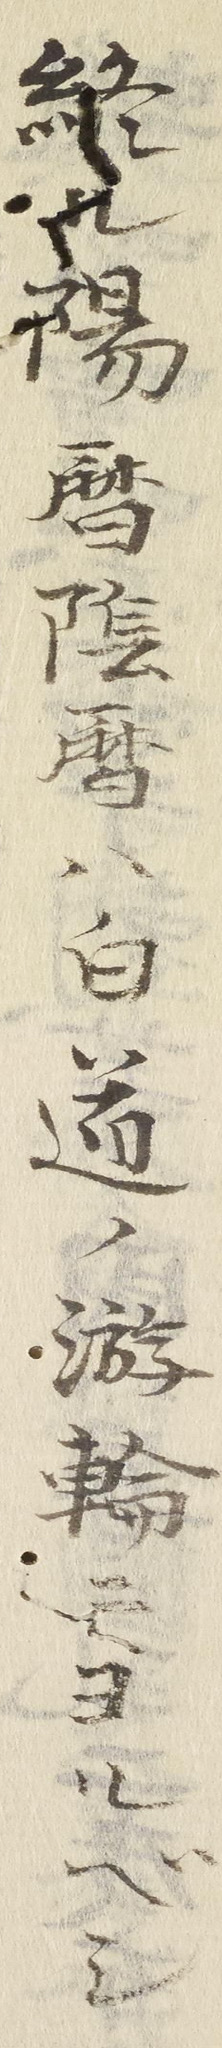終ル陽暦陰暦ハ白道ノ游輪ニヨルベシ
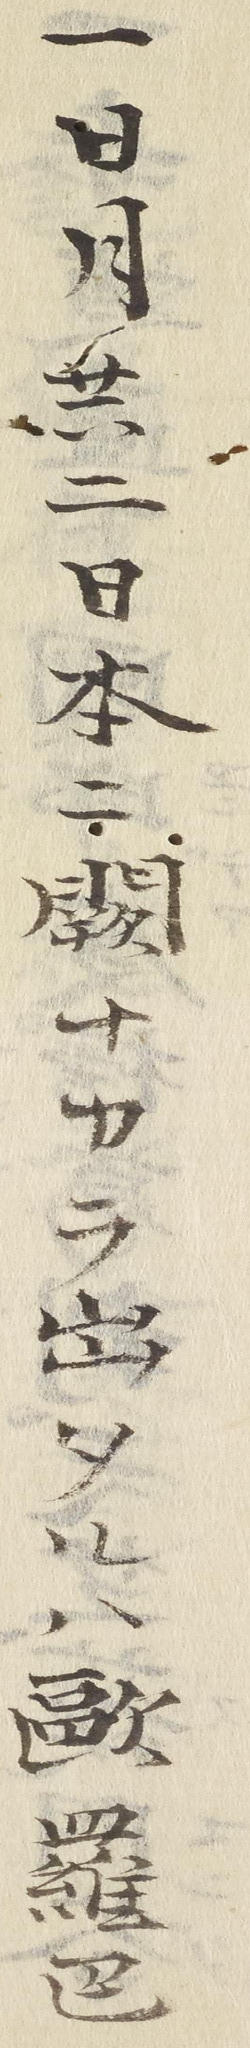一日月共ニ日本ニ闕ナカラ出タルハ欧羅巴
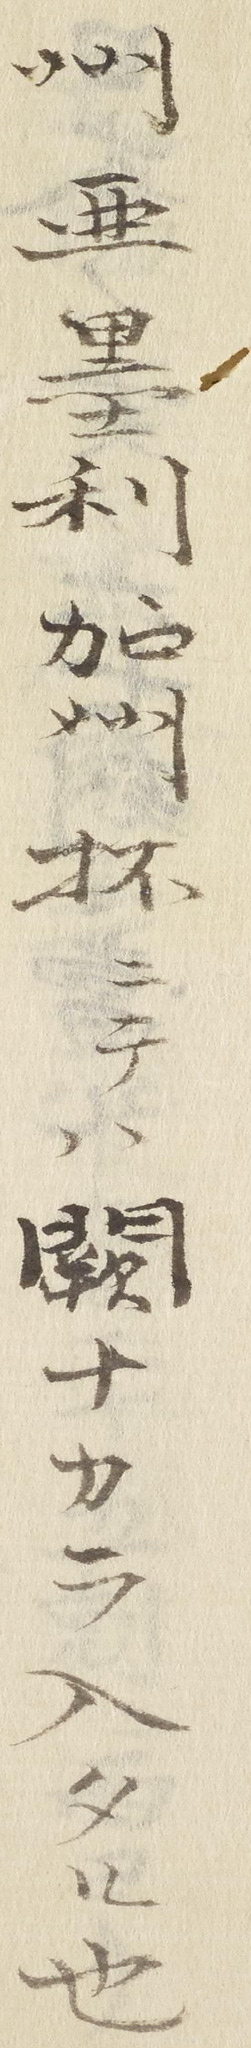州亜墨利加州抔ニテハ闕ナカラ入タル也
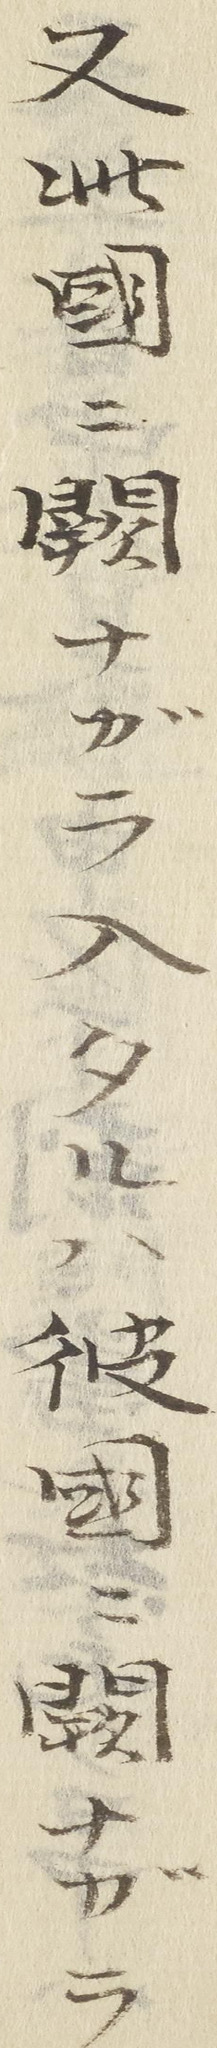又此国ニ闕ナガラ入タル彼国ニ闕ナガラ
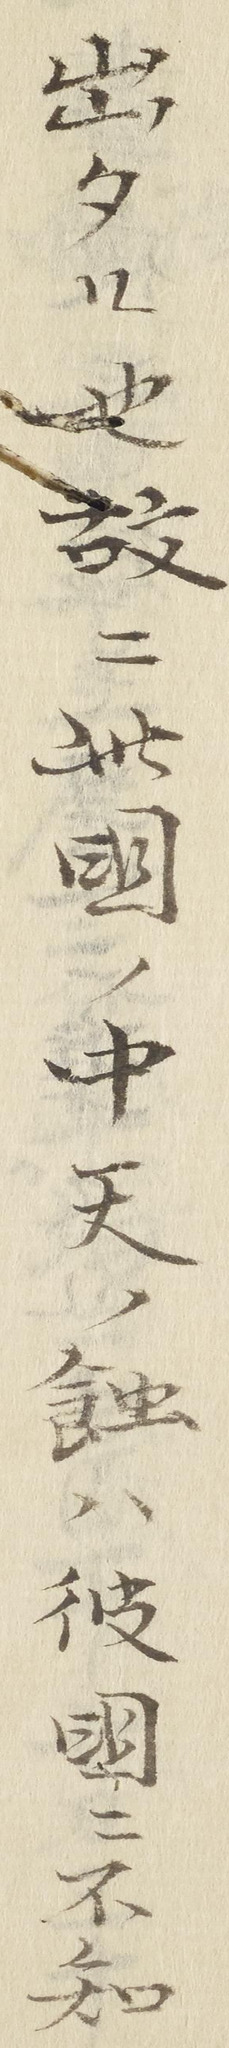出タル也故ニ此国ノ中天ノ蝕ハ彼国ニ不知
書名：天象話説
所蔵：東京大学地震研究所図書室 Earthquake Research Institute Library, The University of Tokyo, JAPAN
